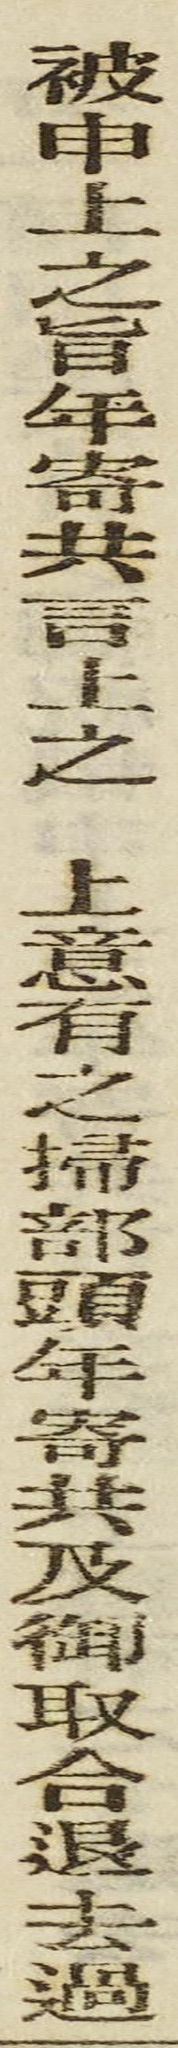被申上之旨年寄共言上之上意有之掃部頭年寄共及御取合退去過
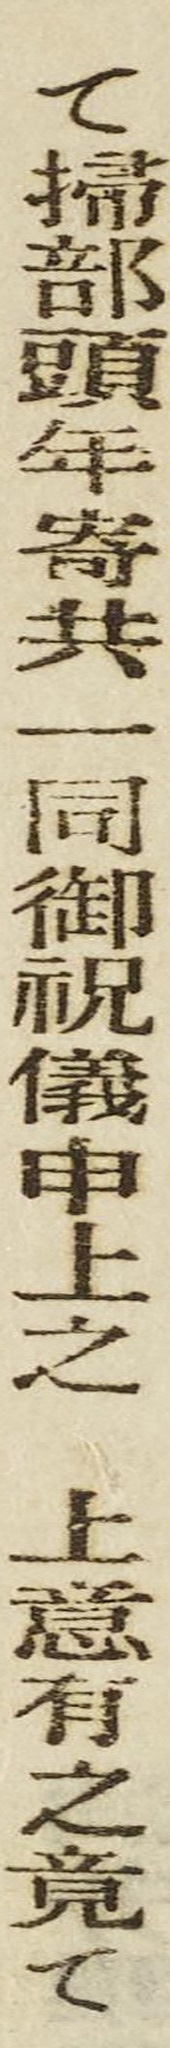て掃部頭年寄共一同御祝儀申上之上意有之竟て
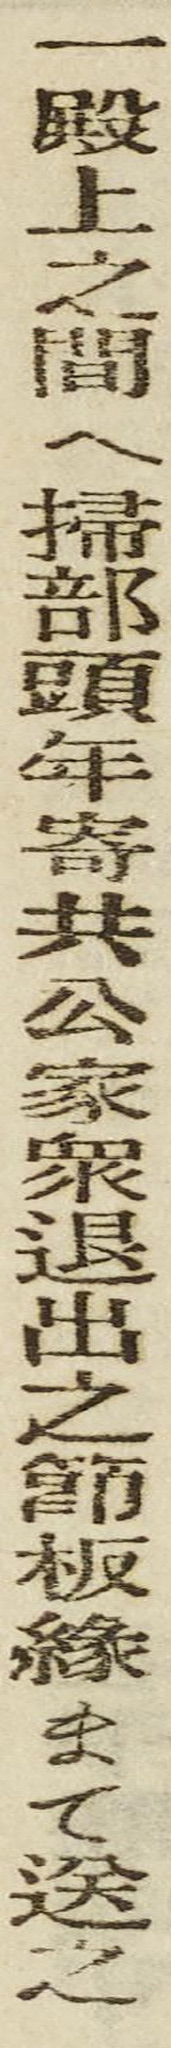一殿上ノ間へ掃部頭年寄共公家衆退出之節板縁まて送之
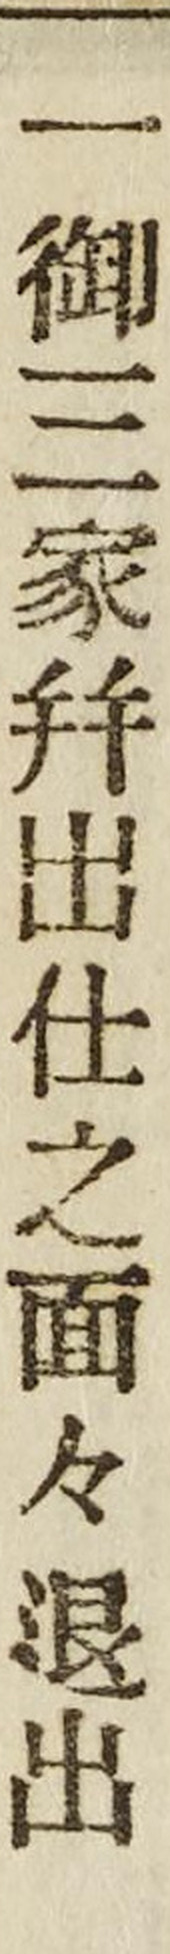一御三家幷出仕之面々退出
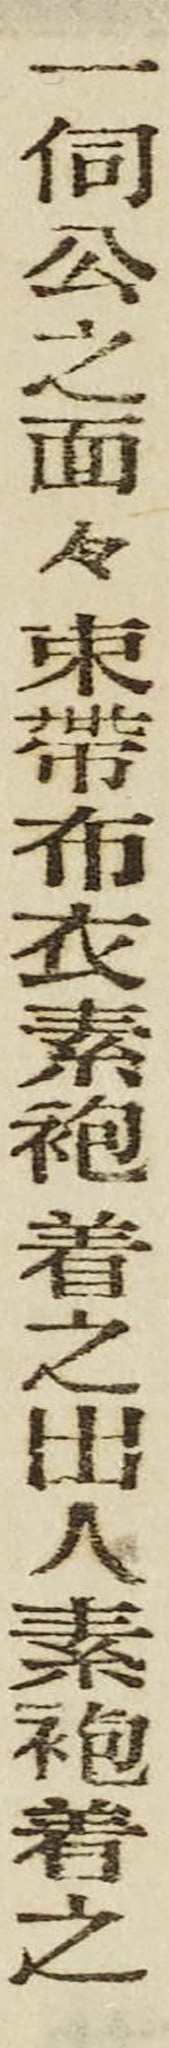一伺公之面々束帯布衣素袍着之出人素袍着之
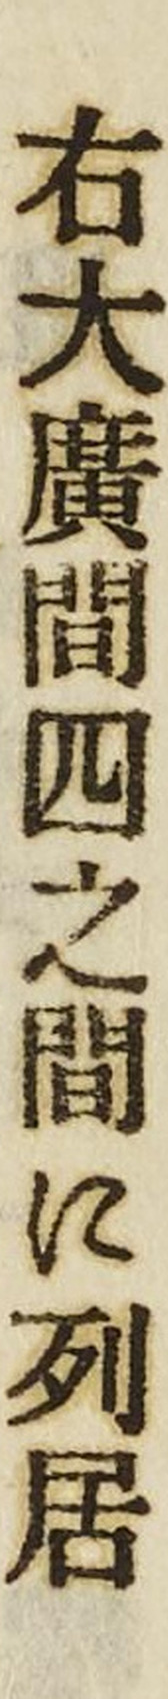右大広間四之間に列居
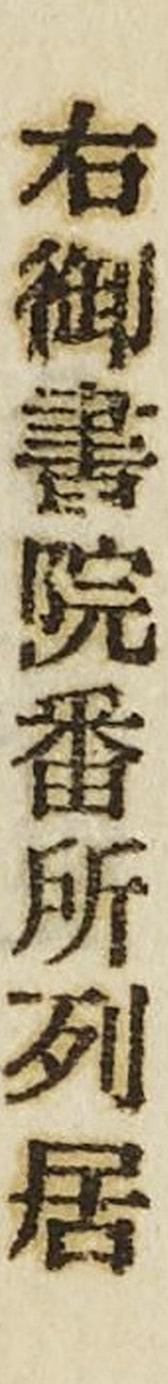右御書院番所列居
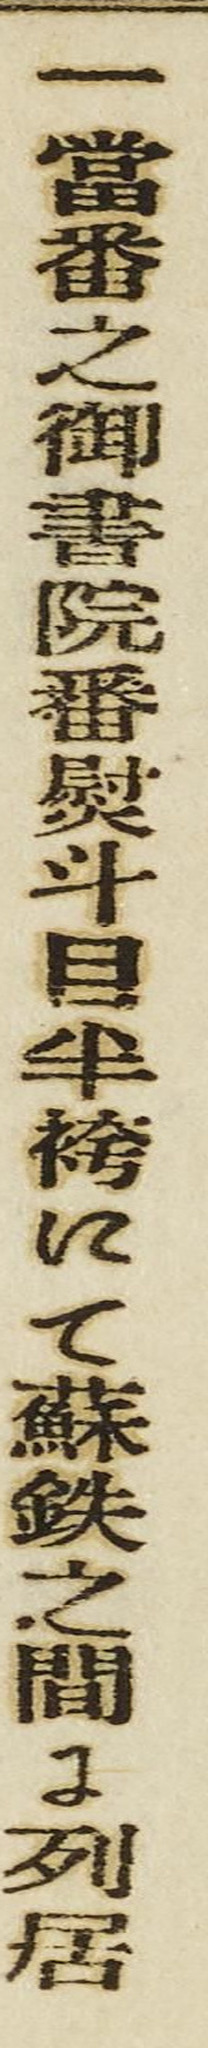一当番之御書院番熨斗目半袴にて蘇鉄之間に列居
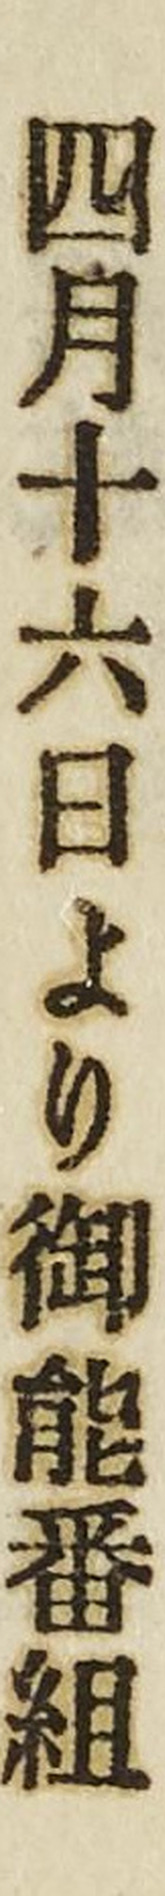四月十六日より御能番組
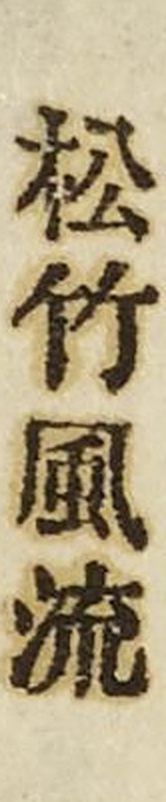松竹風流

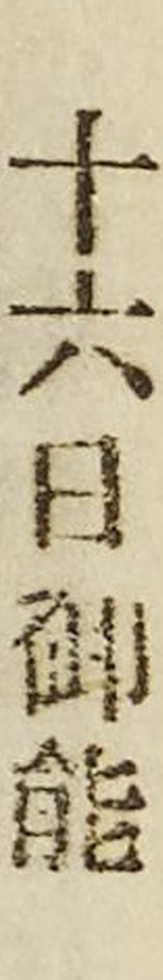十六日御能

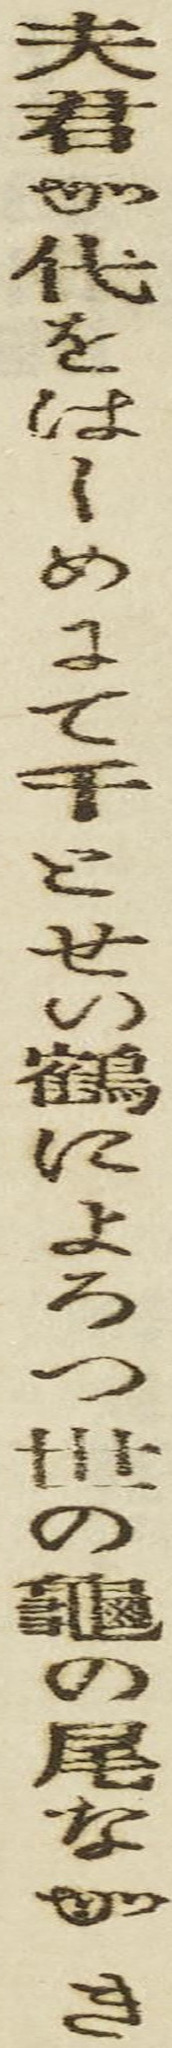夫君か代をはしめにて千とせい鶴によろつ世の亀の尾なかき
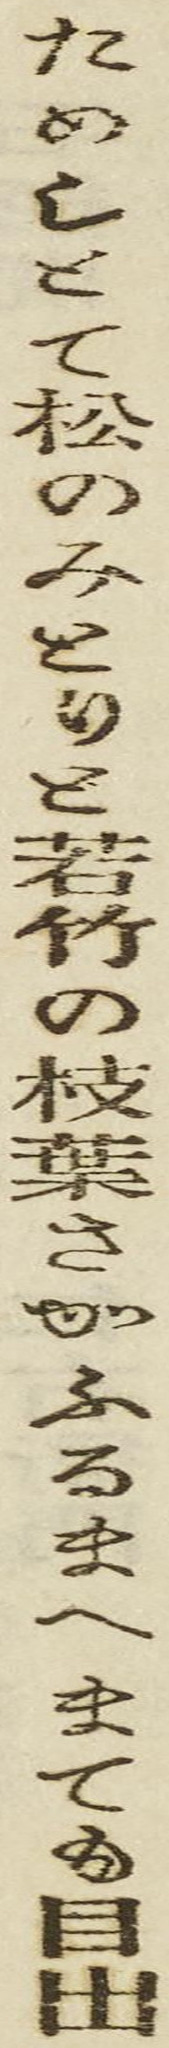ためしとて松のみとりと若竹の枝葉さかふるまへまても目出
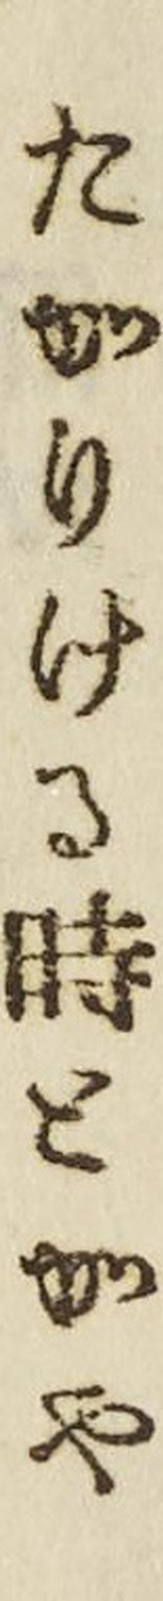たかりける時とかや
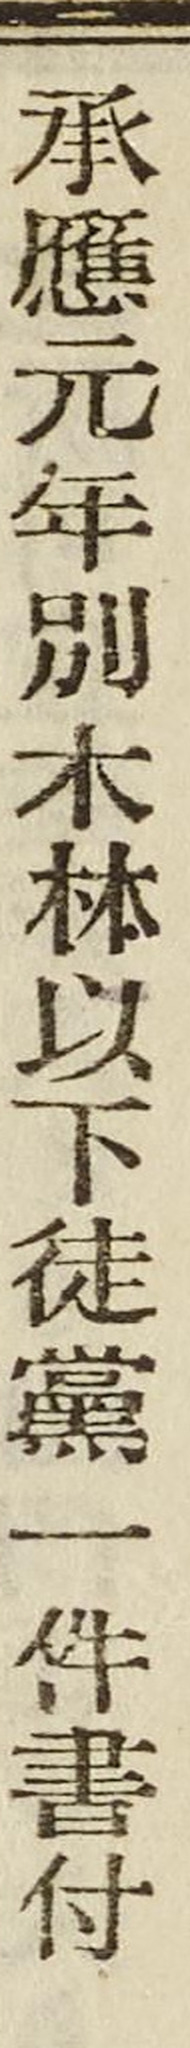承応元年別木林以下徒党一件書付
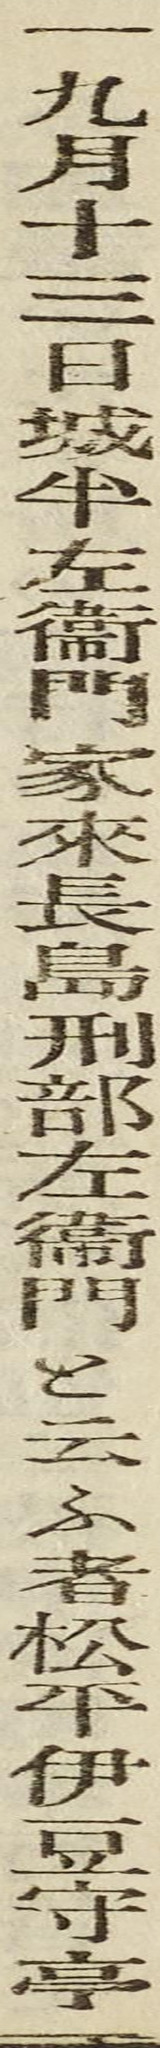一九月十三日城半左衞門家来長島刑部左衞門と云ふ者松平伊豆守亭
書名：史籍集覽　朝鮮陣古文・細井廣澤記・颶風紀事・天明七年將軍宣下次第書　全
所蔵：東京大学地震研究所図書室 Earthquake Research Institute Library, The University of Tokyo, JAPAN
